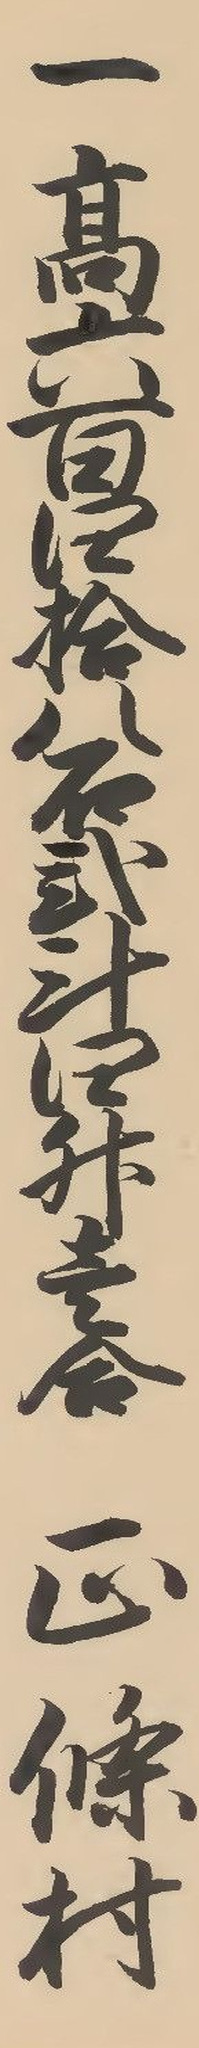一髙六百四拾八石弐斗四升壱合正條村
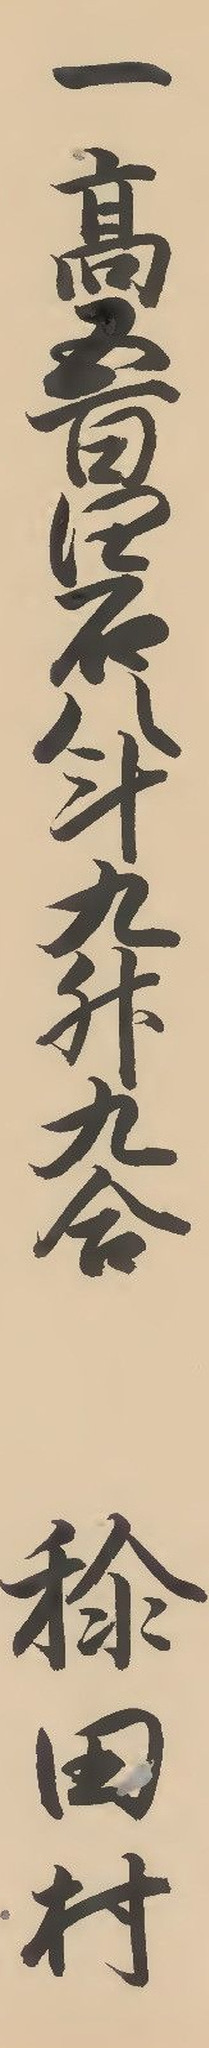一髙五百四石八斗九升九合田村
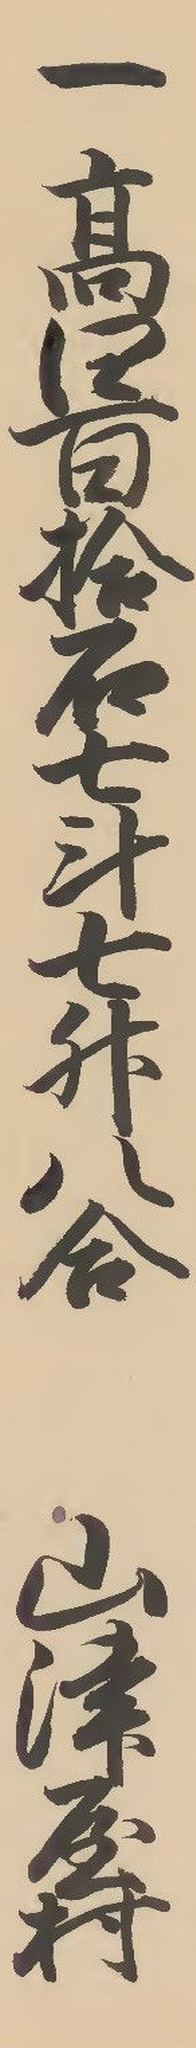一髙四百拾石七斗七升八合山津屋村

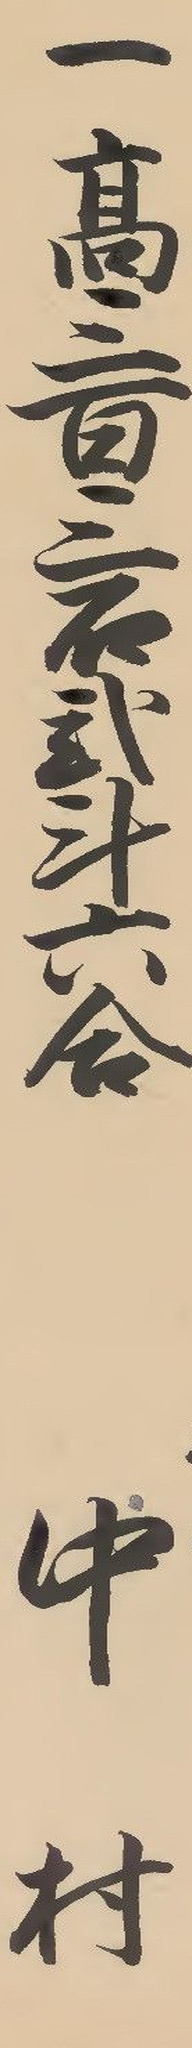一髙三百三石弐斗六合中村
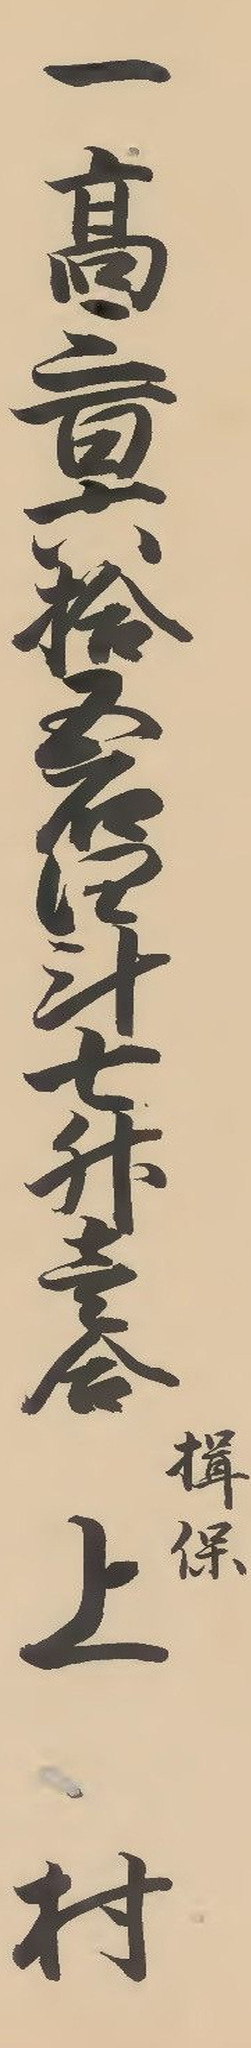一髙三百六拾五石四斗七升壱合上村
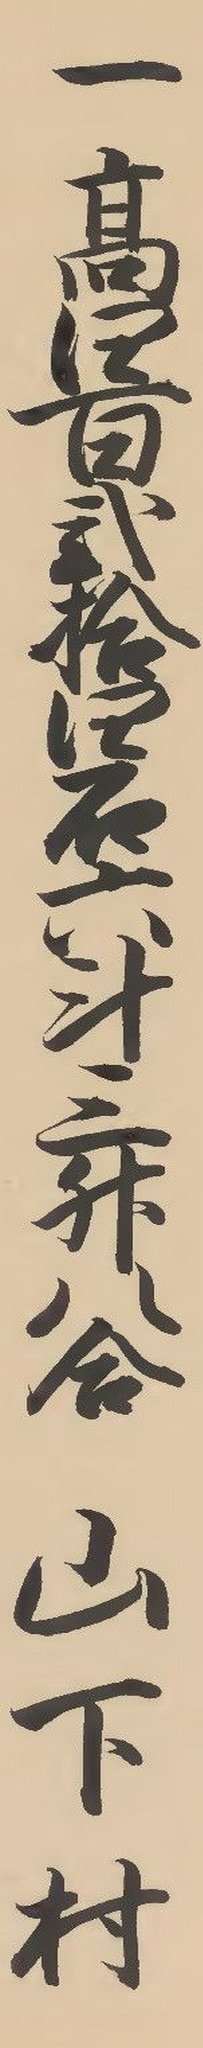一髙四百弐拾四石六斗三升八合山下村
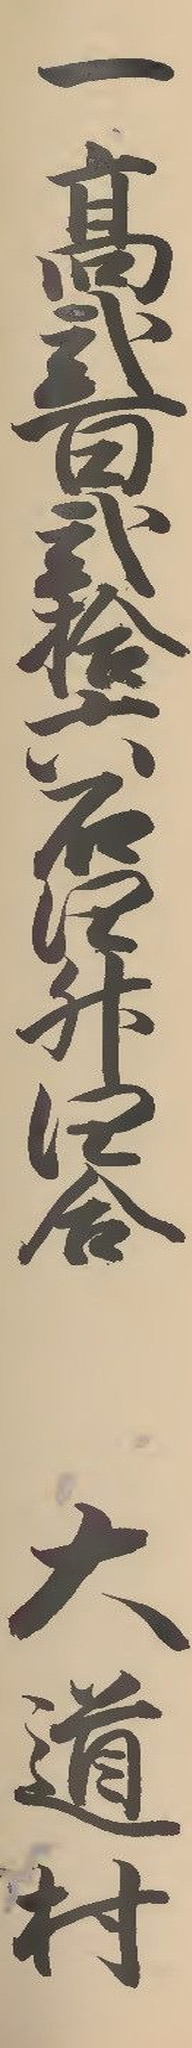一髙弐百弐拾六石四升四合大道村
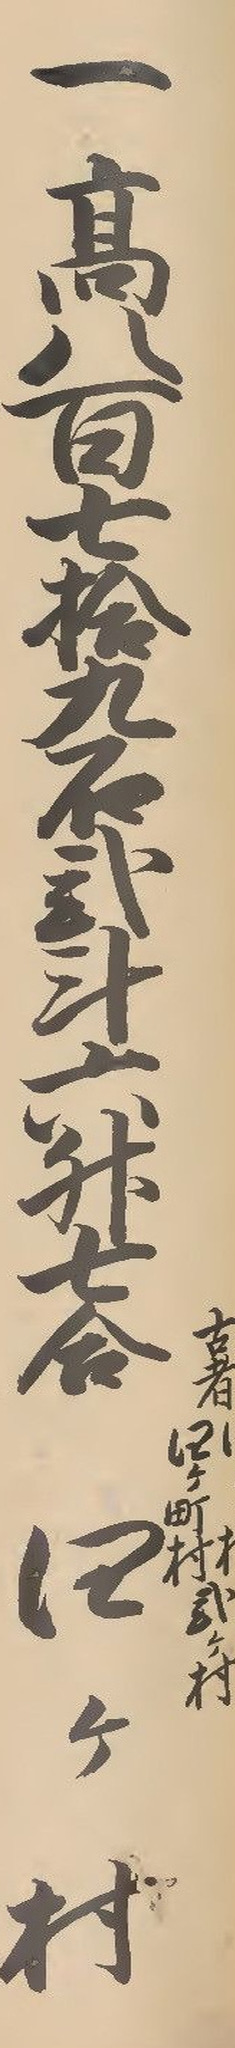一髙八百七拾九石弐斗六升七合四ケ村
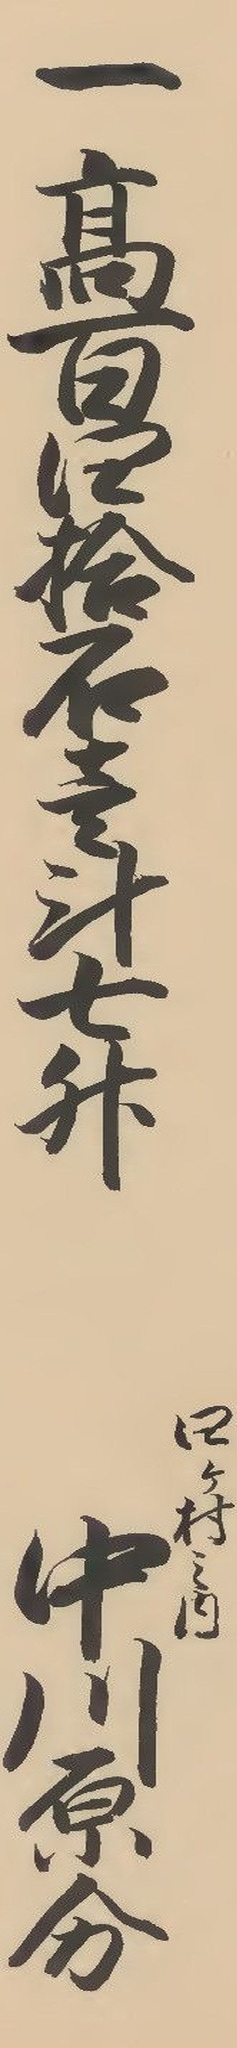一髙百四拾石壱斗七升中川原分
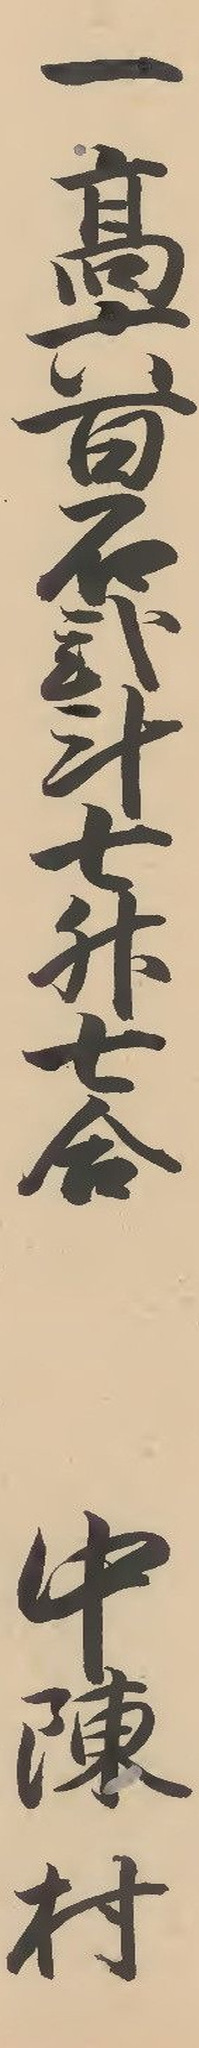一髙六百石弐斗七升七合中陳村
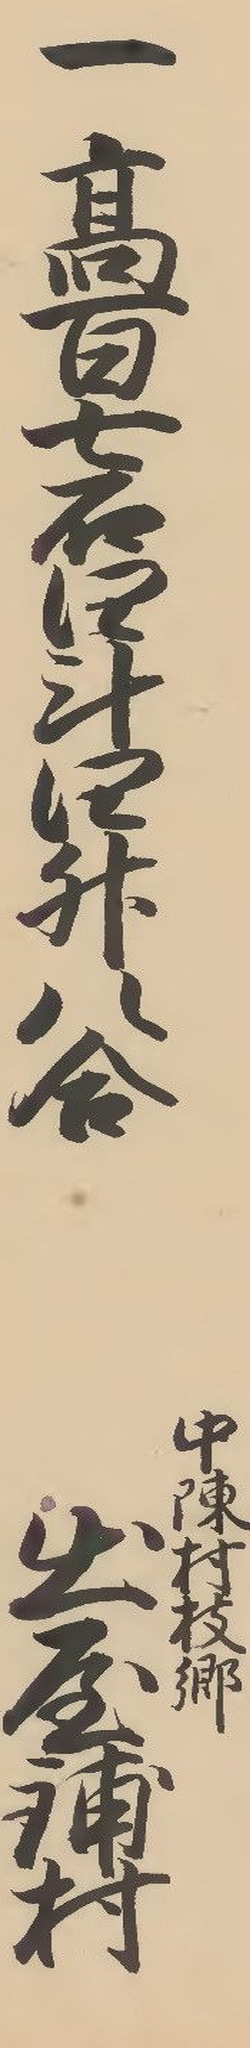一髙百七石四斗八合出屋鋪村

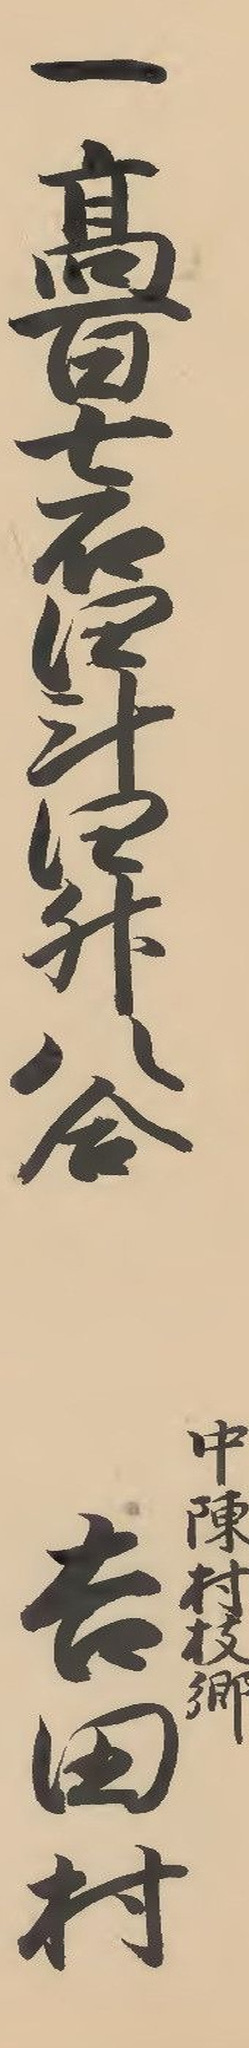一髙百七石四斗四升八合吉田村
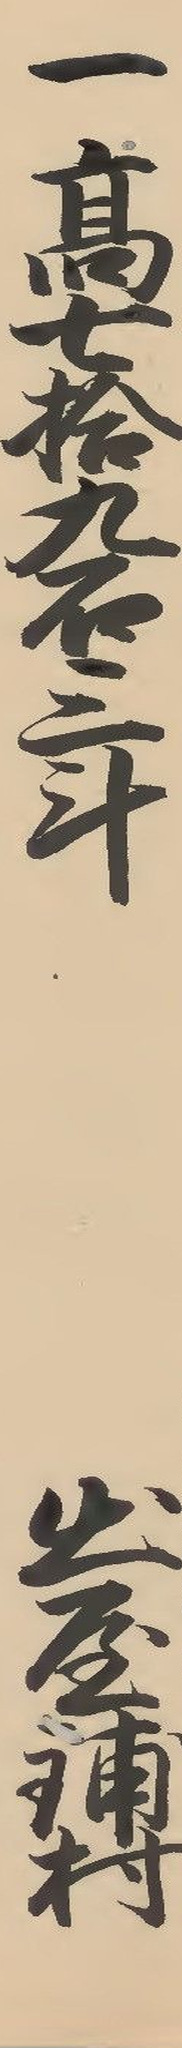一髙七拾九石三斗出屋鋪村
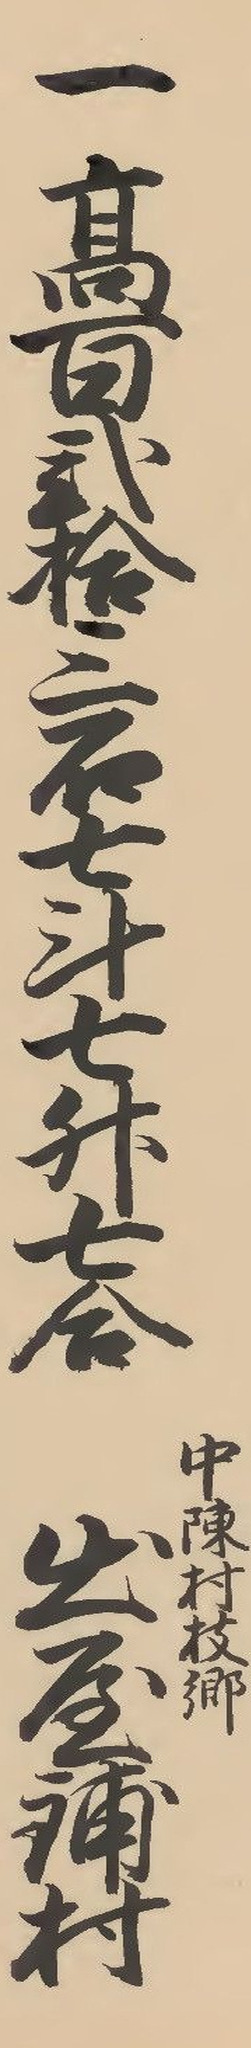一髙百弐拾三石七斗七升七合出屋鋪村
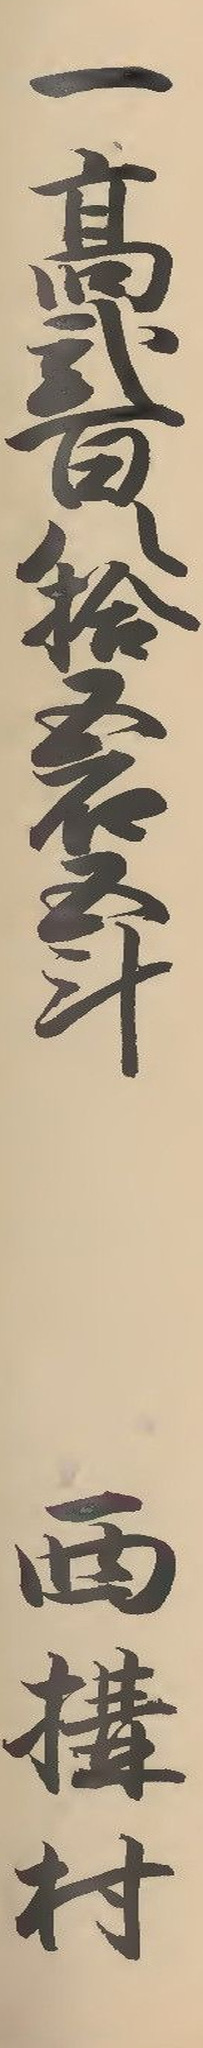一髙弐百八拾五石五斗西構村
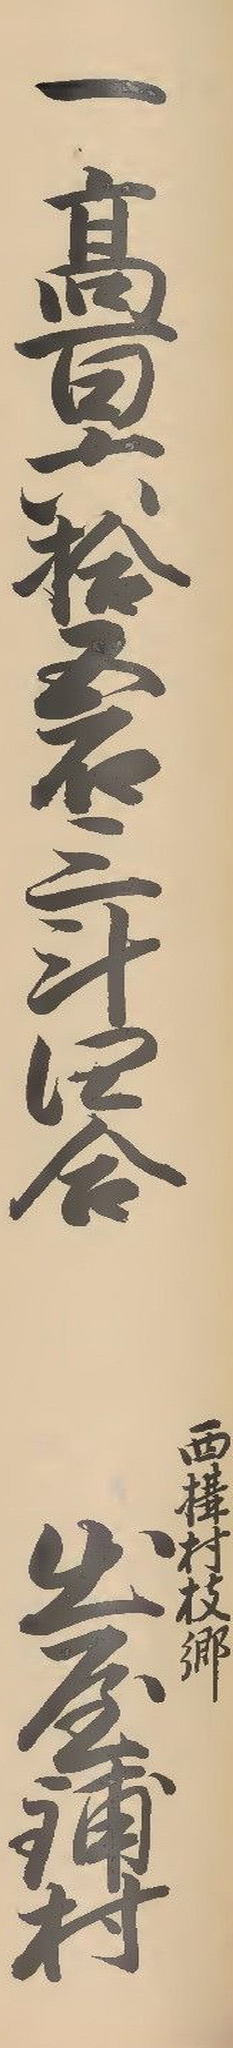一髙百六拾五石三斗四合出屋鋪村
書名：播磨国郷帳
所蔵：国立公文書館 National Archives of Japan
